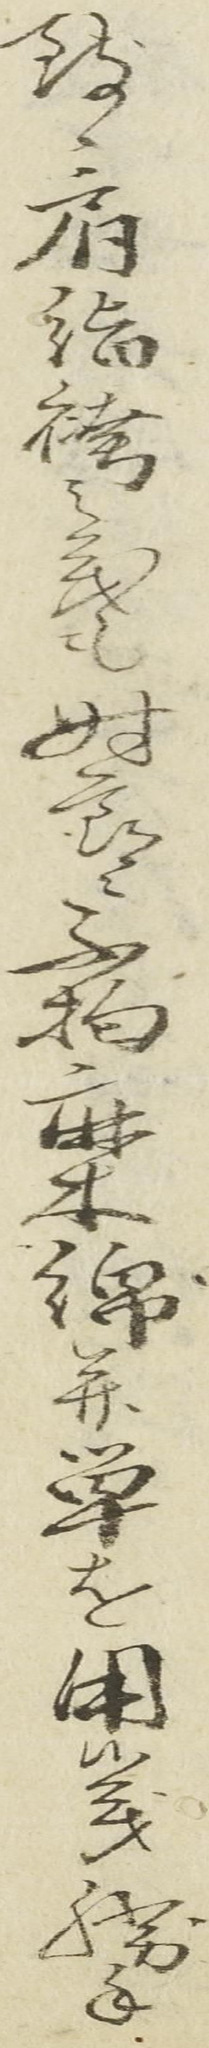致候肩絹袴之義も時節に不拘麻木綿幷単を用候義勝手
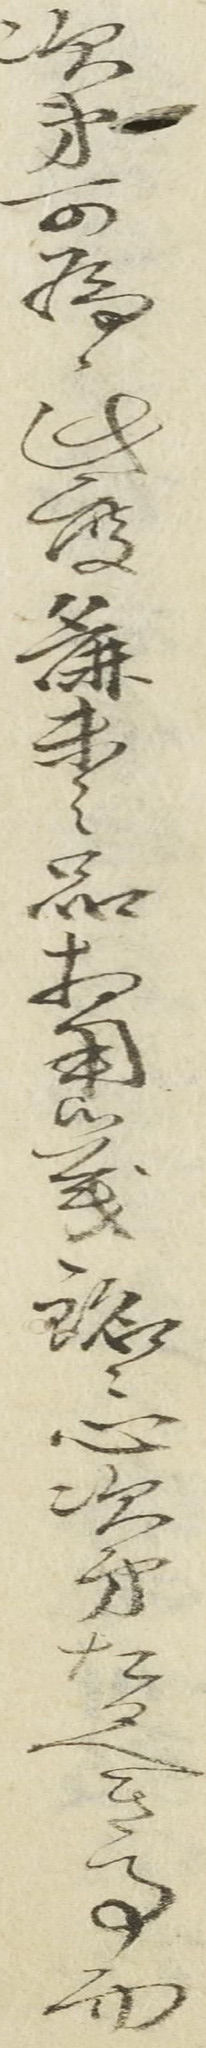次第可為候此度麁末之品相用候義銘々心次第たるべき事勿
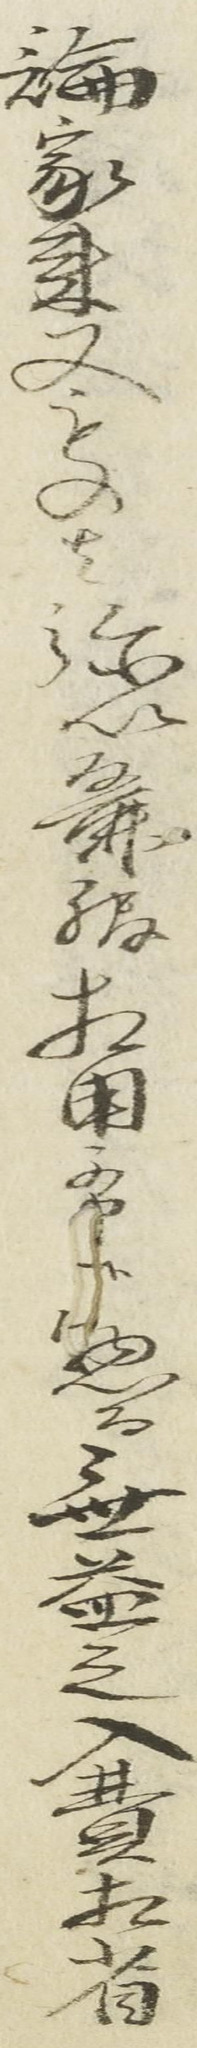論家来又ものは弥以麁服相用之可申候懸る無益之入費相省
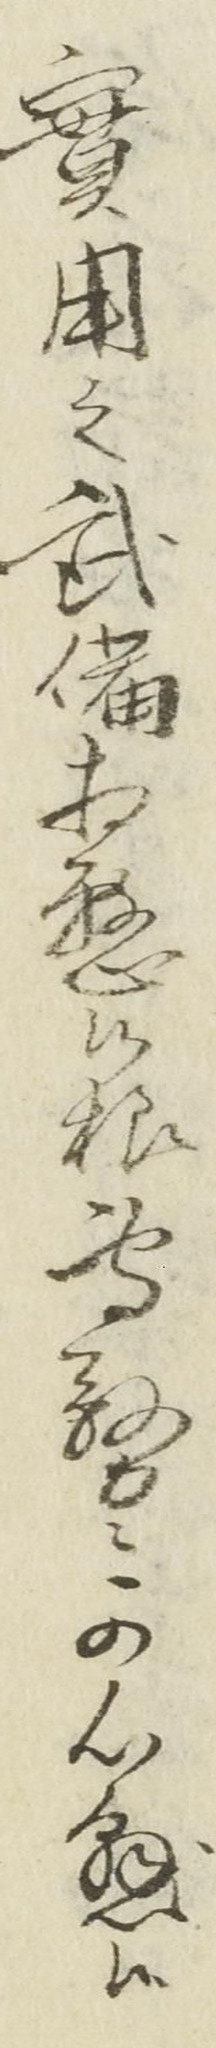実用之武備相整候様専務二可心懸候
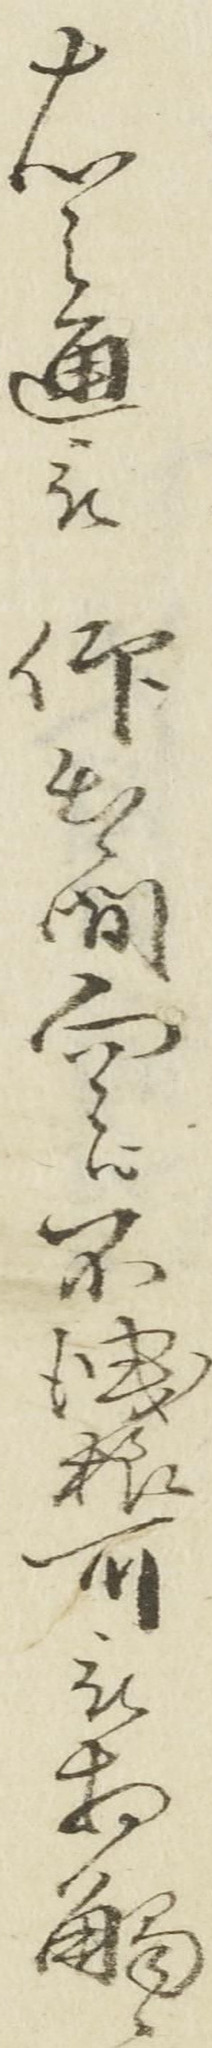右の通り被仰出候間向々え不洩様可被相触候
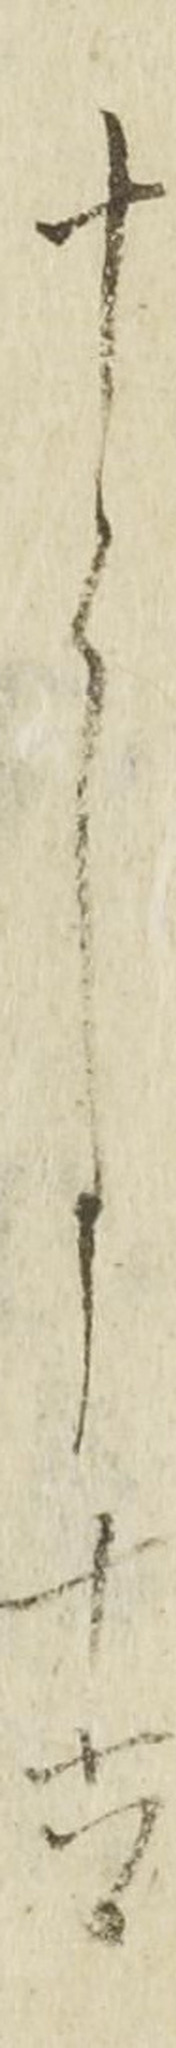十月十六日
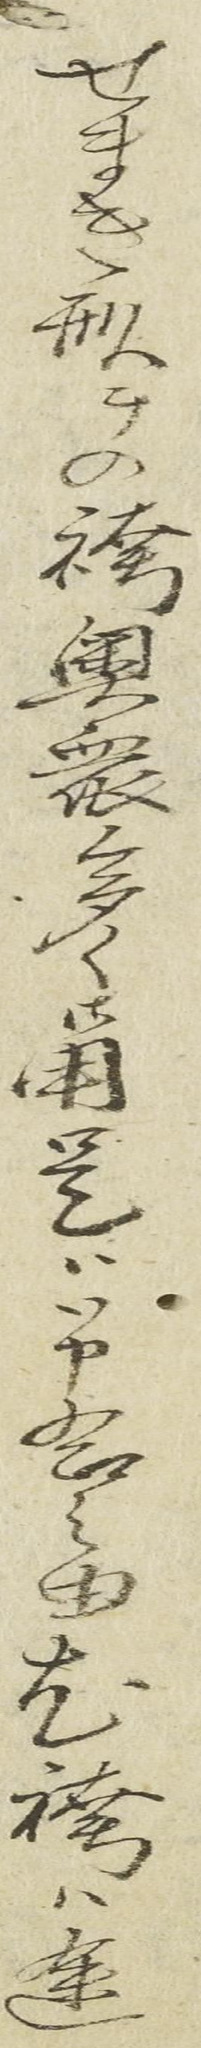せまき形チの袴奥衆多く御用是ハ御申合之由尤袴ハ途
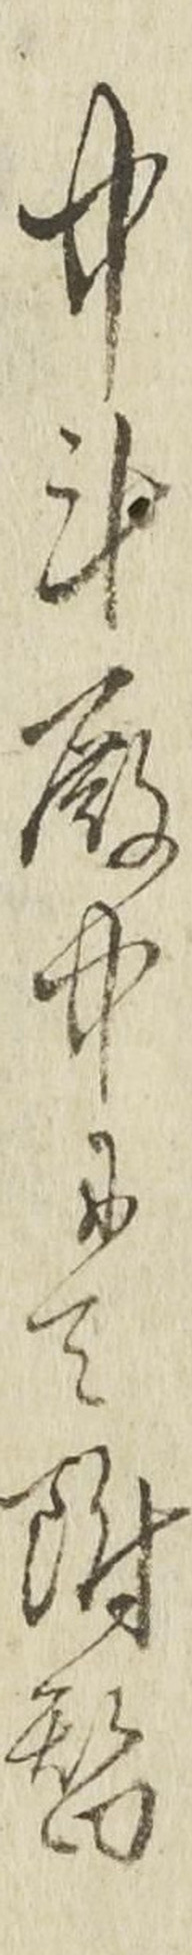中斗殿中にて附替
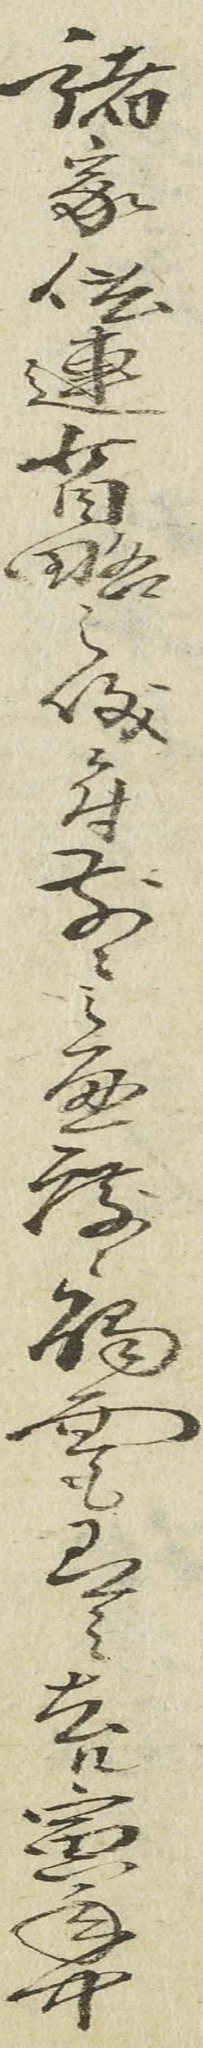諸家供連省略之儀二付前々之通度々触面も有之去ル寅年中
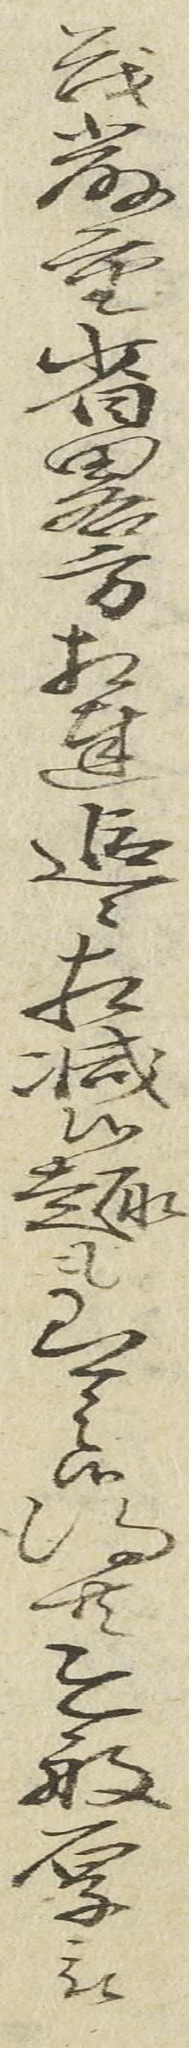茂厳重省略方相達追々相減候趣も有之候得共今般厚被
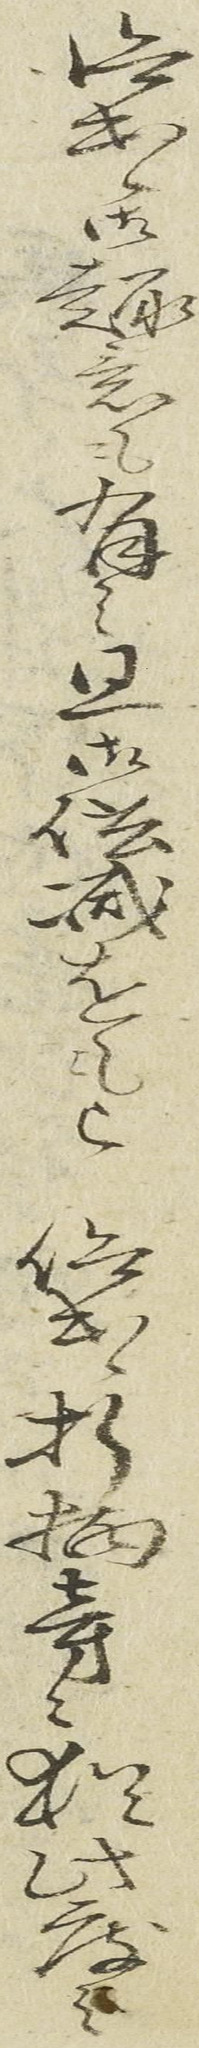仰出候御趣意も有之且御供減をも被仰出候折柄旁々猶此之度之
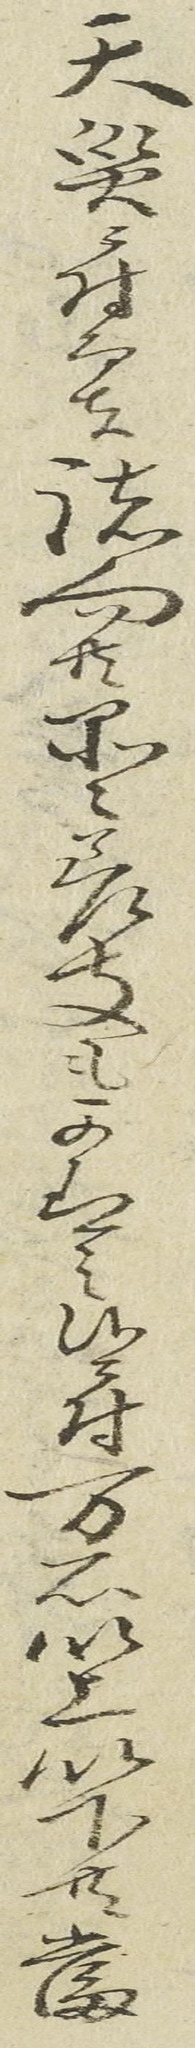天災二付而は諸向共品々差支も可有之候二付万石以上以下共当
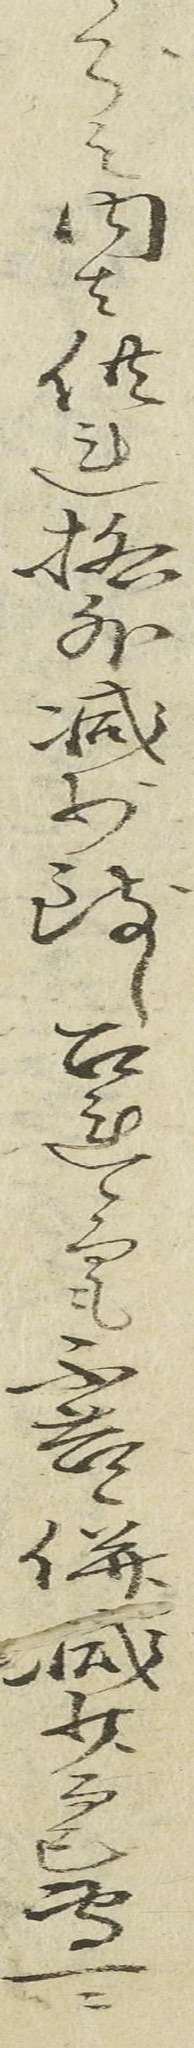分之内は供連格外減少致し召連候而も不苦候併減少而已専一二
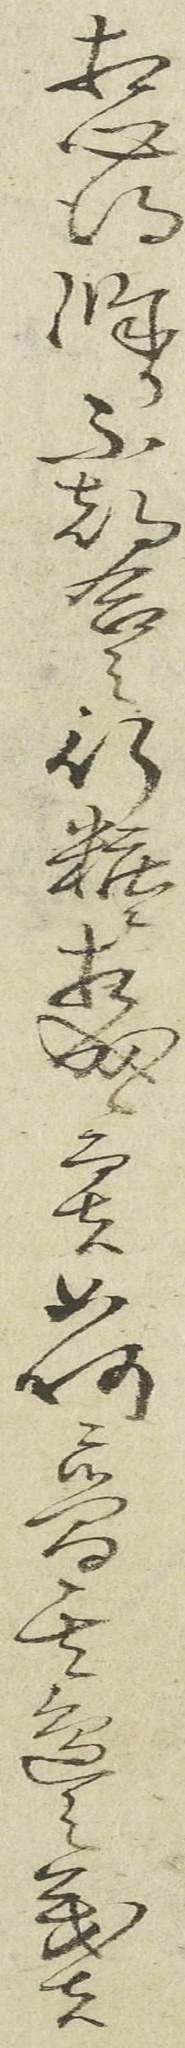相心得餘り不都合之行粧ニ相成候而は如何二候間其辺之義は
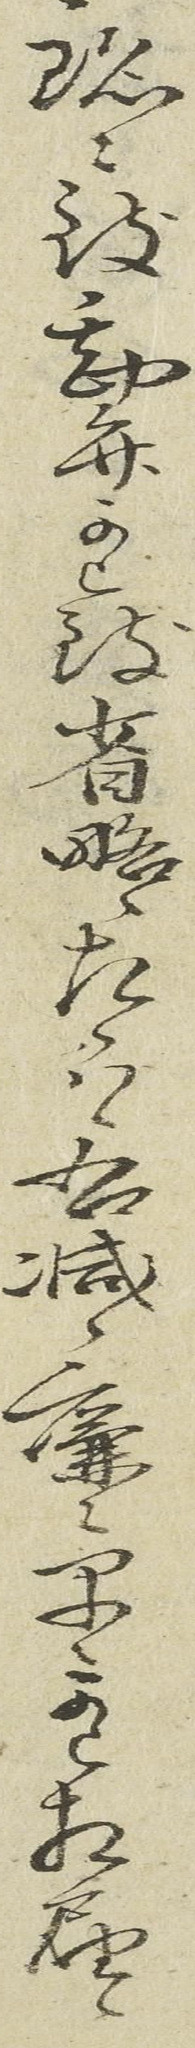銘々致勘弁可被致省略候左候ハゝ右減候廉々早々可被相届候

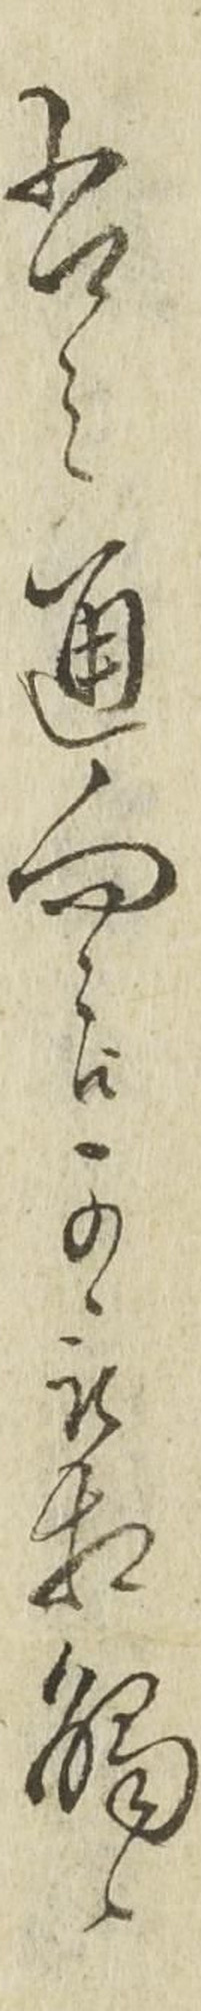右之通向々江可被相触候
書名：安政二乙卯年十月二日大地震之事
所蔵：東京大学地震研究所図書室 Earthquake Research Institute Library, The University of Tokyo, JAPAN
